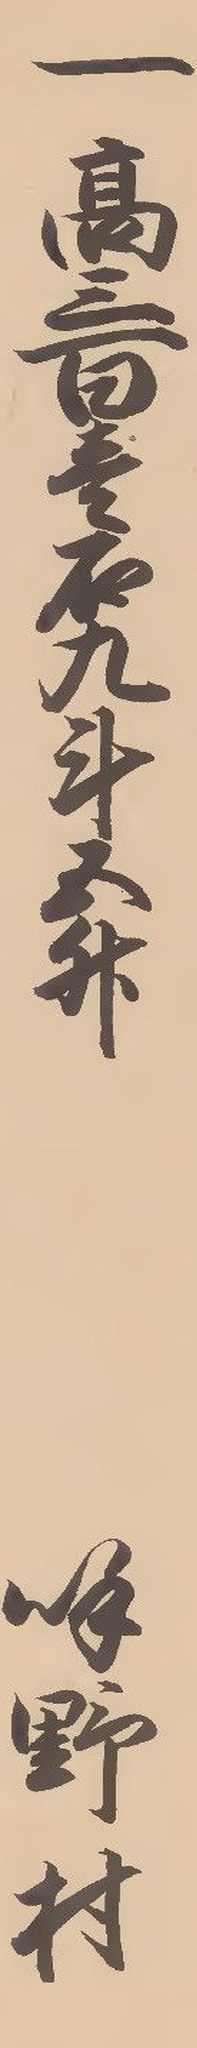一髙三百壱石九斗五升呼野村
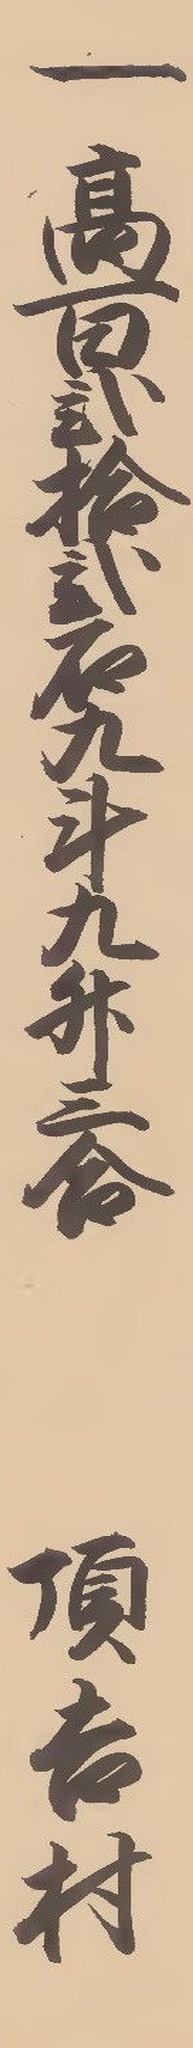一髙百弐拾弐石九斗九升三合頂吉村
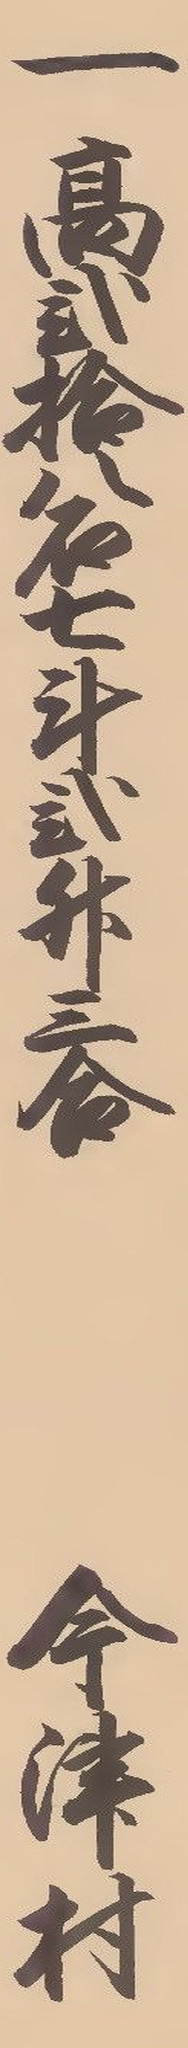一髙弐拾八石七斗弐升三合今津村
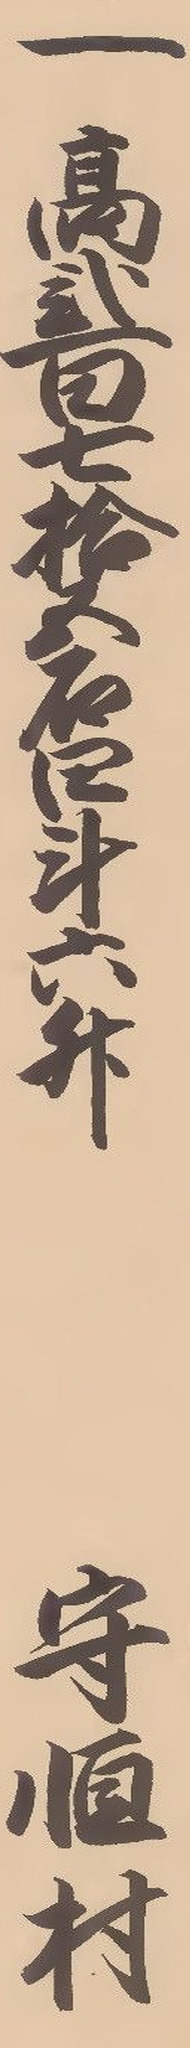一髙弐百七拾五石四斗六升守恒村
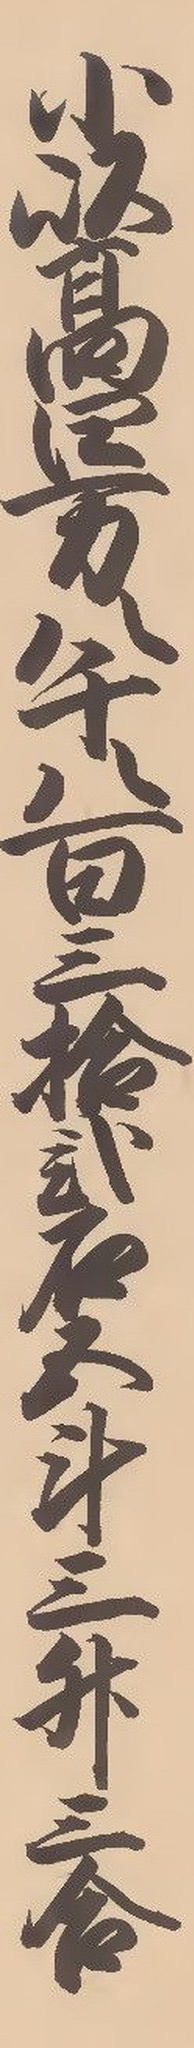小以髙四万八千八百三拾弐石五斗三升三合

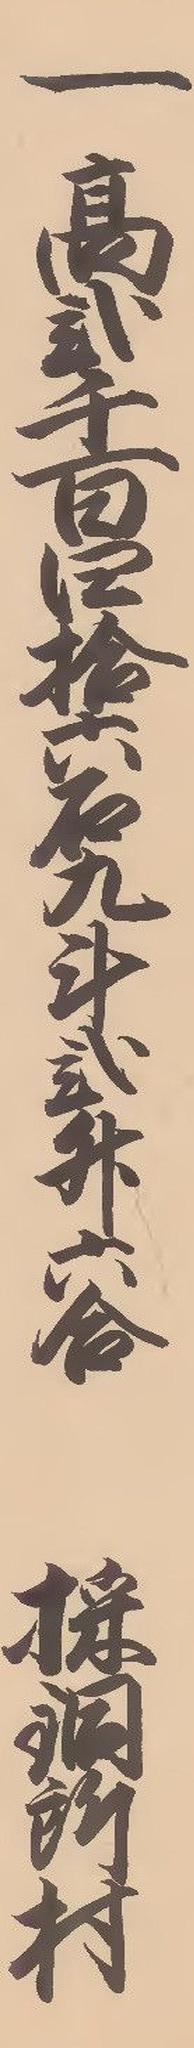一髙弐千百四拾六石九斗弐升六合採銅所村
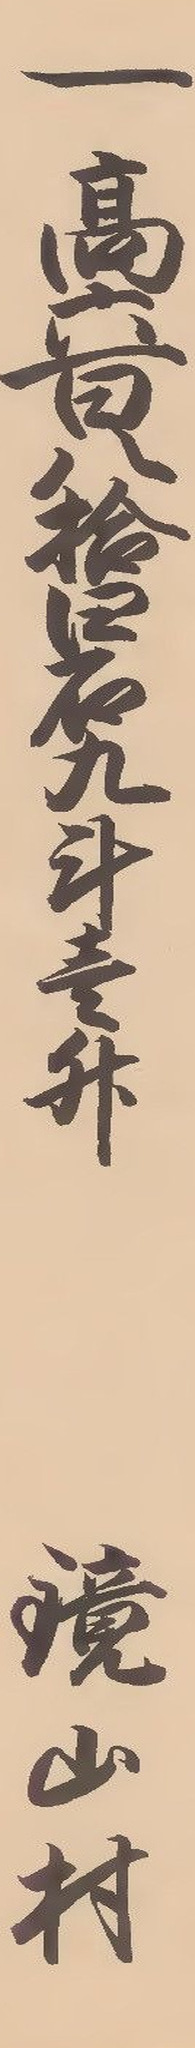一髙六百八拾四石九斗壱升鏡山村
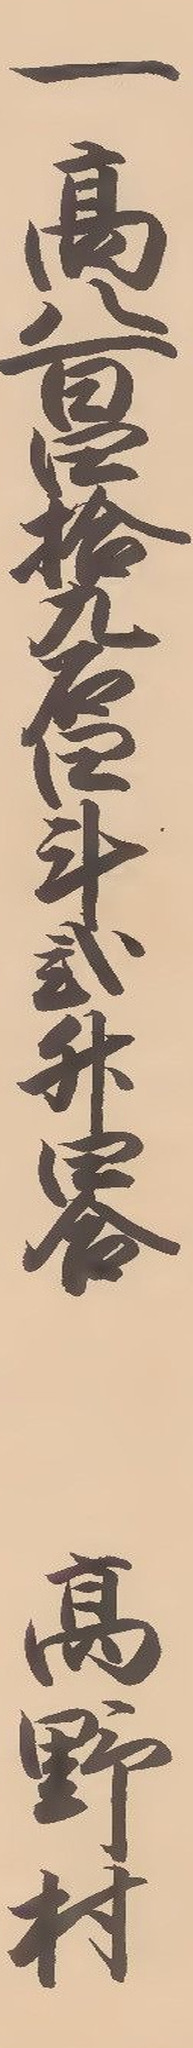一髙八百四拾九石四斗弐升四合髙野村
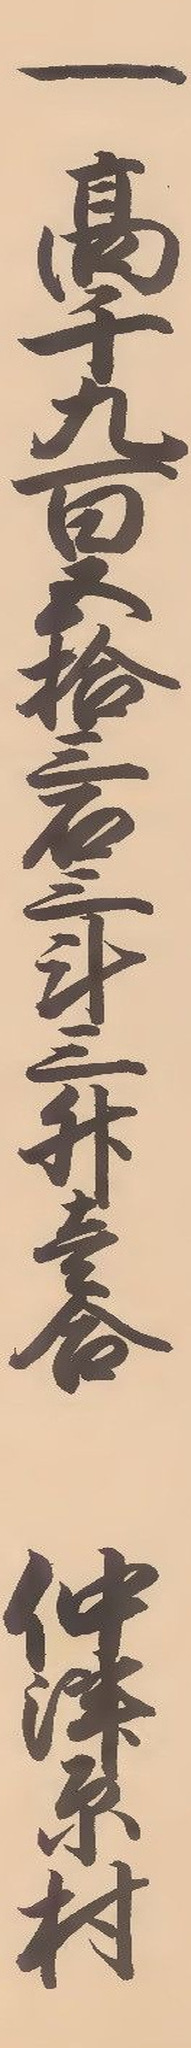一髙千九百五拾三石三斗三升壱合仲津原村
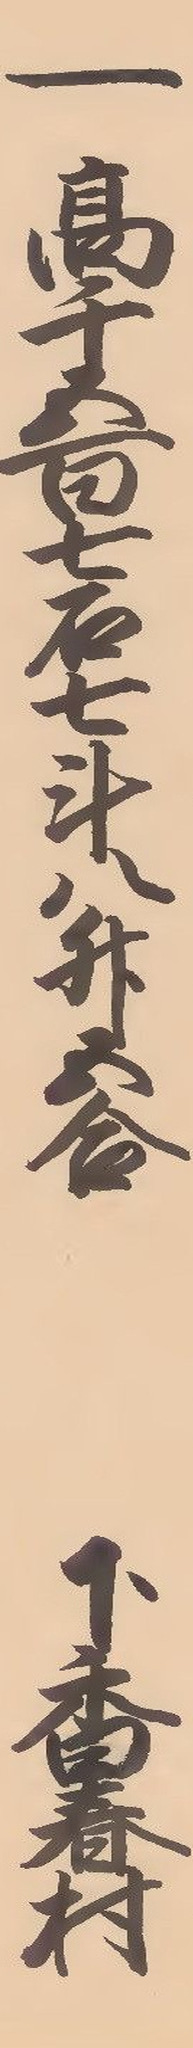一髙千五百七石七斗八升五合下香春村
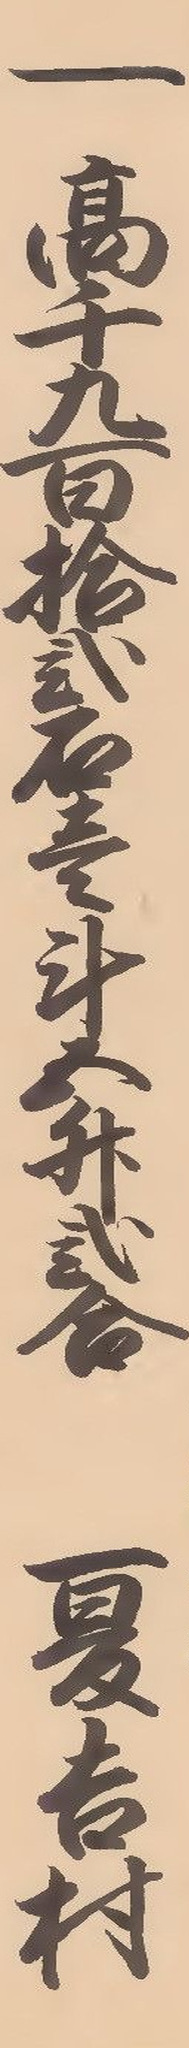一髙千九百拾弐石壱斗五升弐合夏吉村
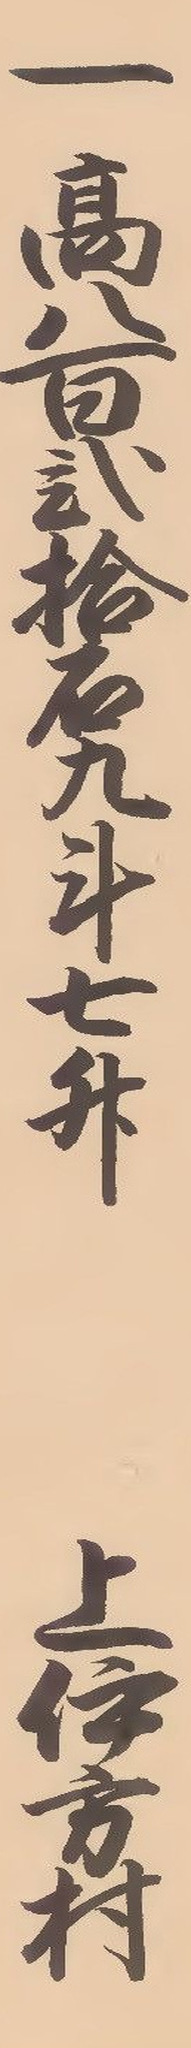一髙八百弐拾石九斗七升上伊方村

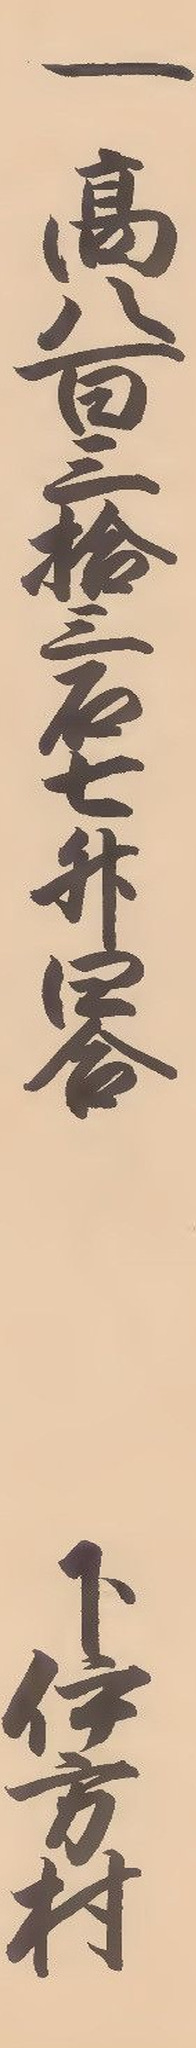一髙八百三拾三石七升四合下伊方村
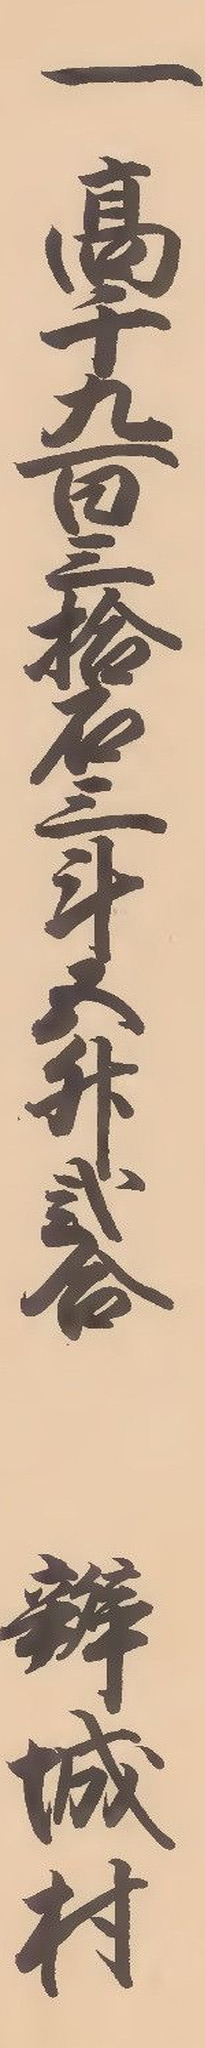一髙千九百三拾石三斗五升弐合辨城村
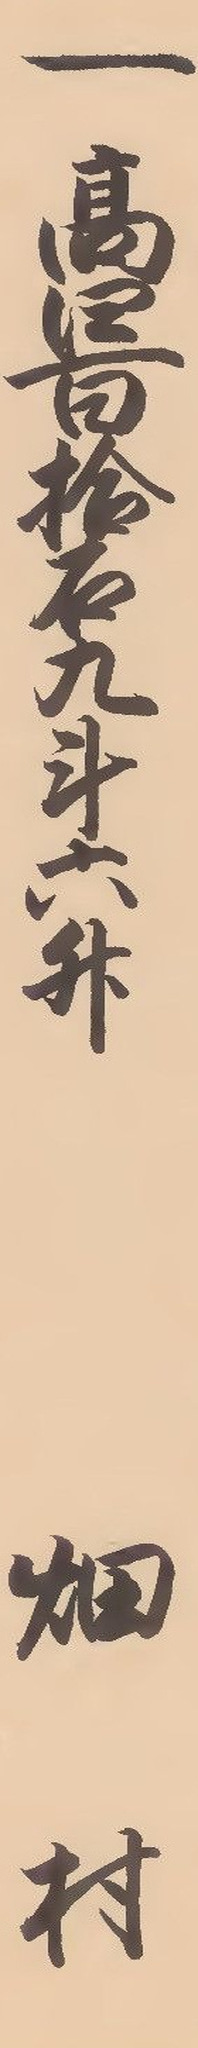一髙四百拾石九斗六升畑村
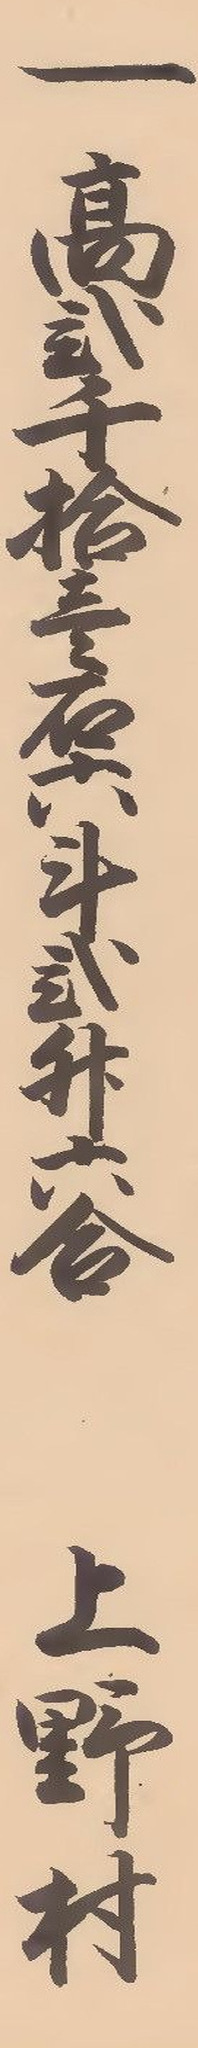一髙弐千拾壱石六斗弐升六合上野村
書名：豊前国郷帳
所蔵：国立公文書館 National Archives of Japan
